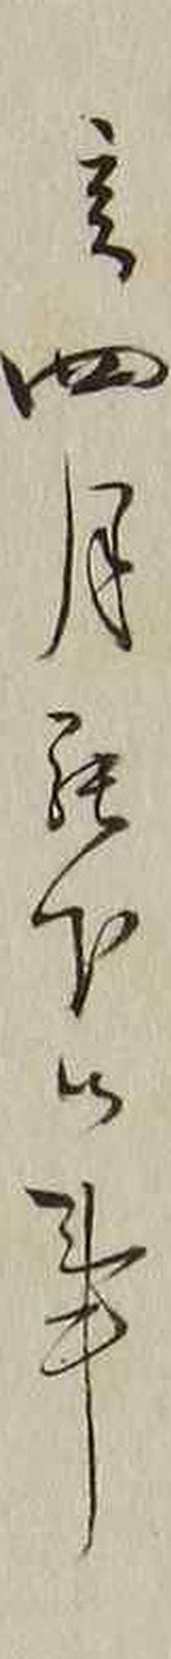亥四月罷下候事
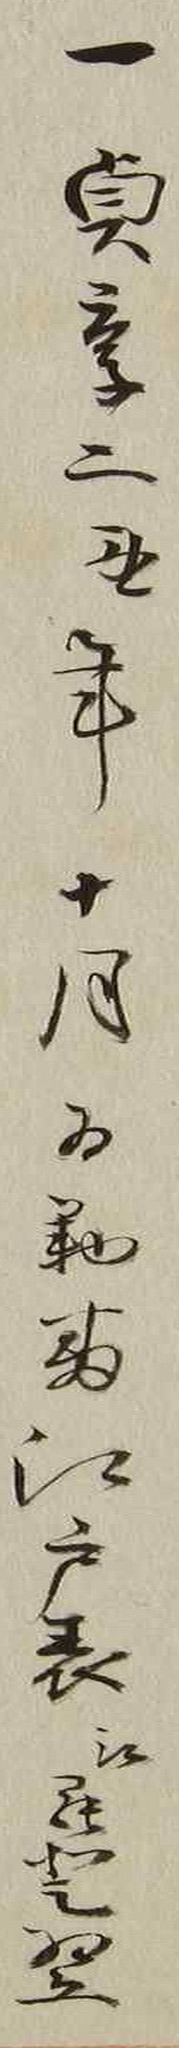一貞享二丑年十月為勤番江戸表え罷登翌
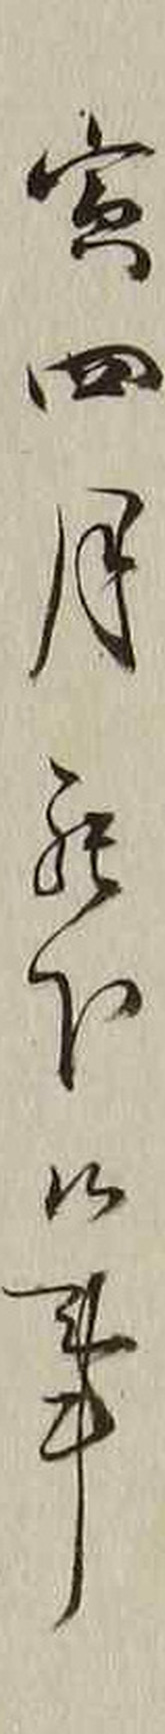寅四月罷下候事
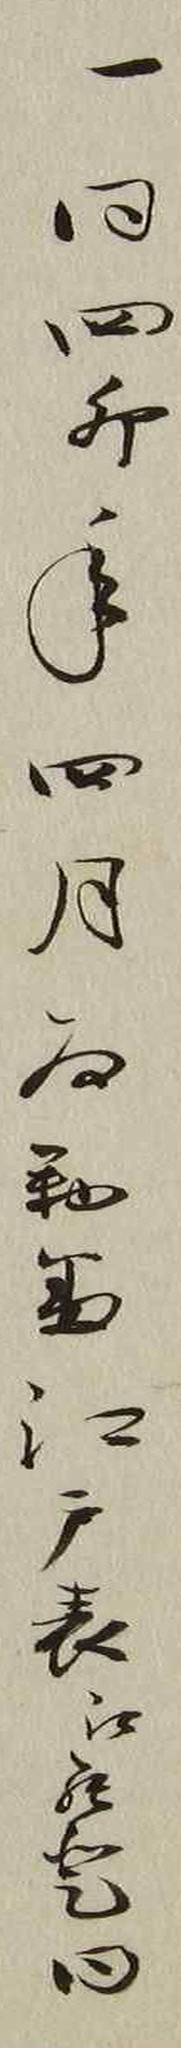一同四卯年四月為勤番江戸表え罷登同
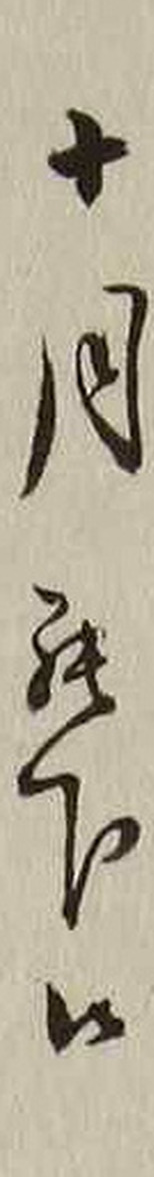十月罷下候
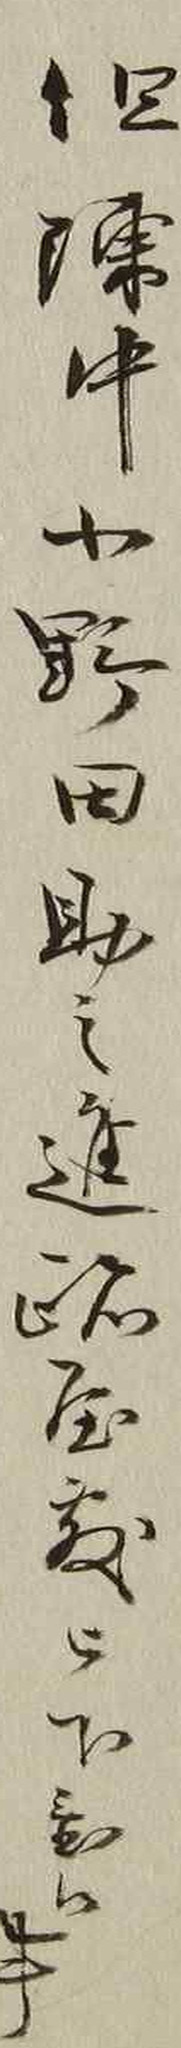但陣中小野田助之進跡屋敷被下置候事
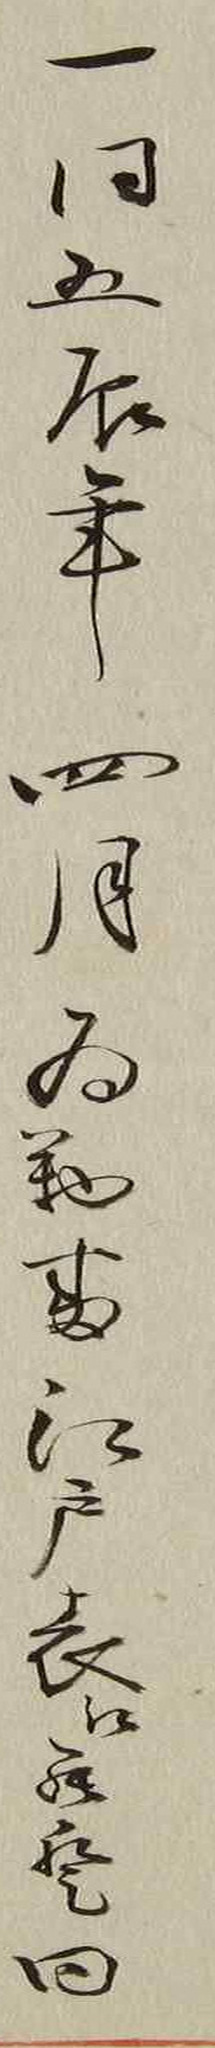一同五辰年四月為勤番江戸表え罷登同
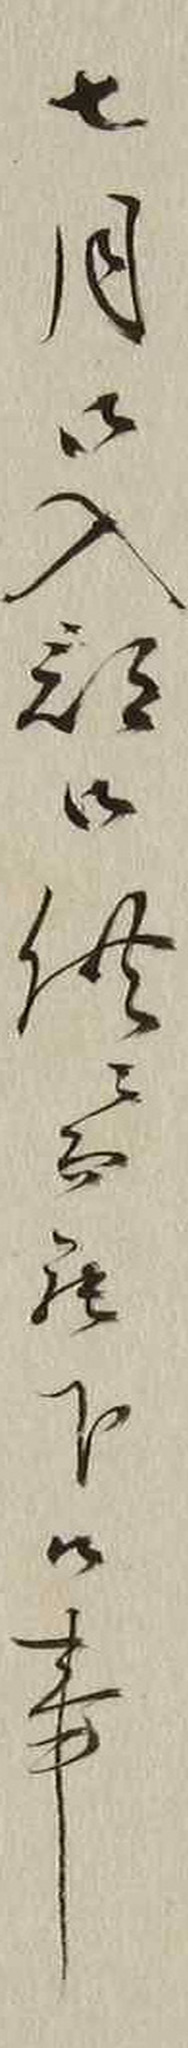七月御入部御供に而罷下候事
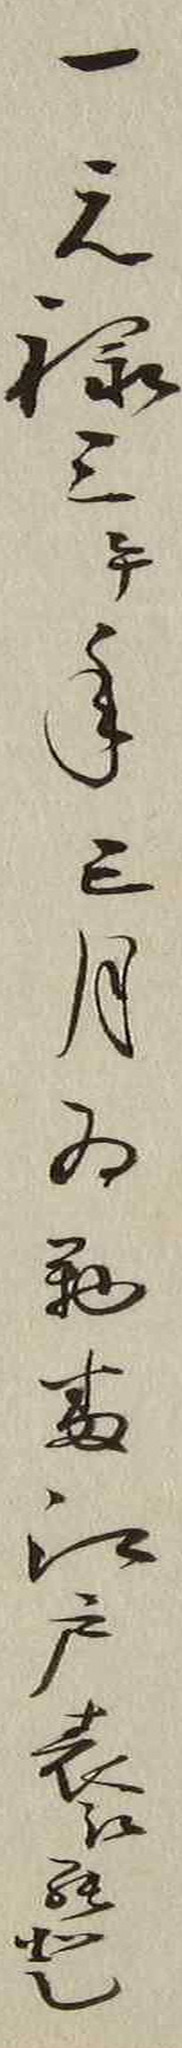一元禄三午年三月為勤番江戸表え罷登
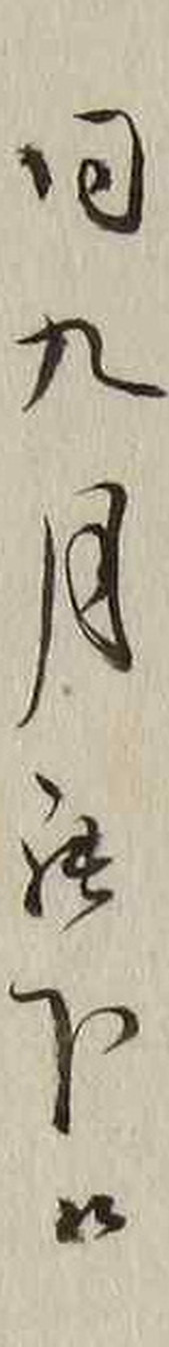同九月罷下候
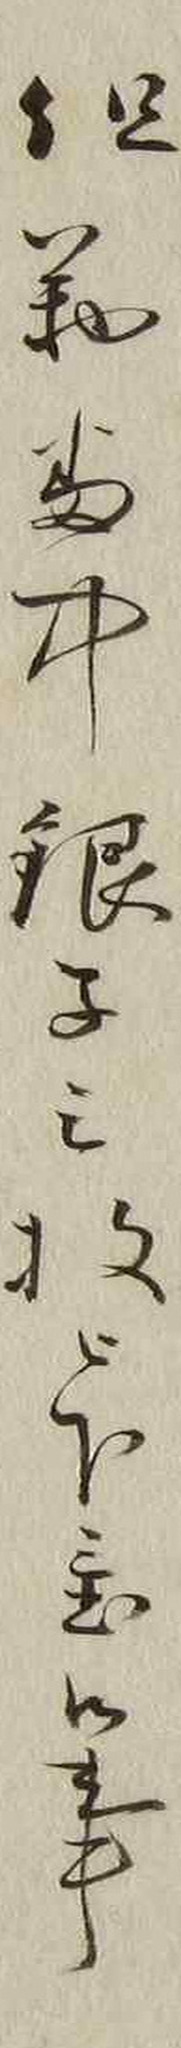但勤番中銀子三枚被下置候事
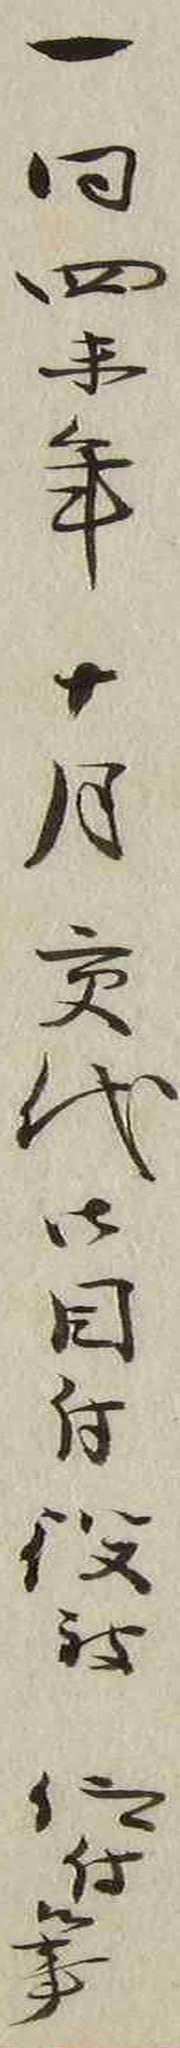一同四未年十月交代御目付役被仰付候事
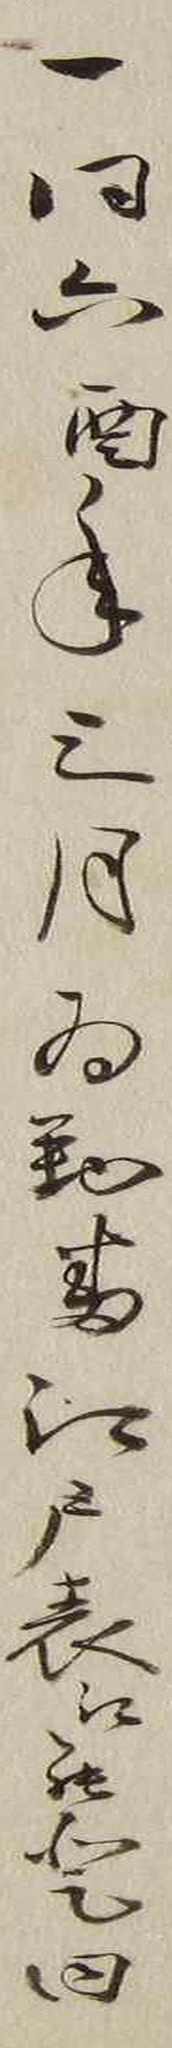一同六酉年三月為勤番江戸表え罷登同
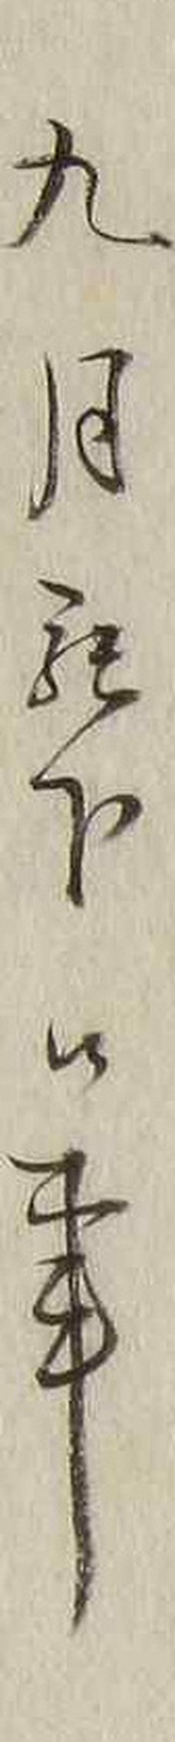九月罷下候事
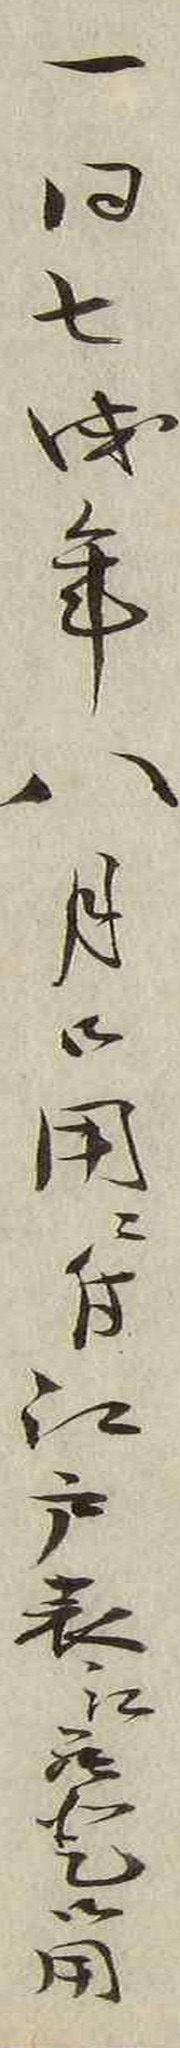一同七戌年八月御用に付江戸表え罷登御用
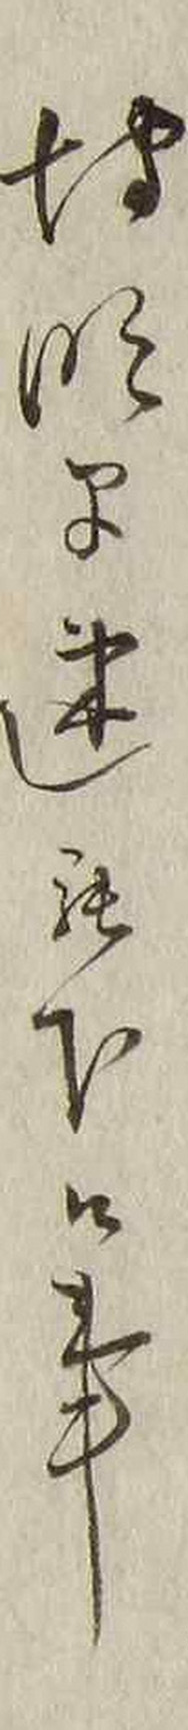埒明早速罷下候事
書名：諸士系譜　巻之157　ね之部1
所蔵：会津若松市立会津図書館
